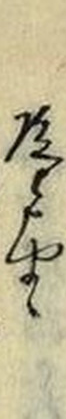殿被申聞候
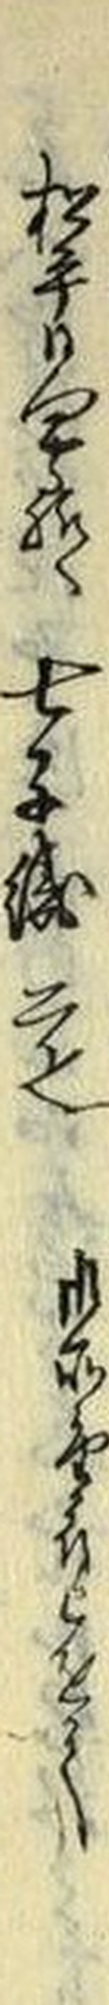松平日向守様へ七子織二疋御所望ニ付被進之
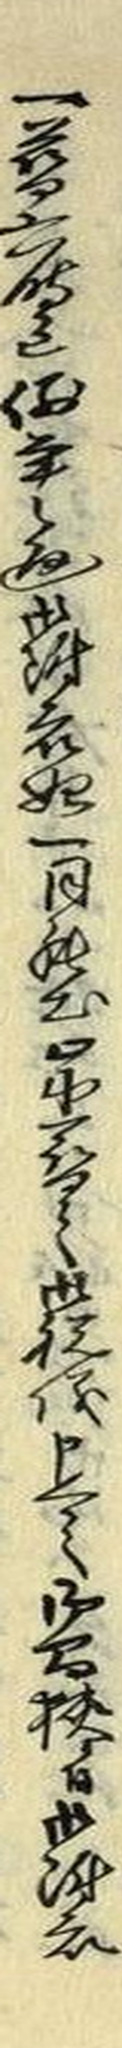一暮六時過例年之通御附衆始一同罷出歳暮之御祝儀申上之御間狭ニ付御附衆
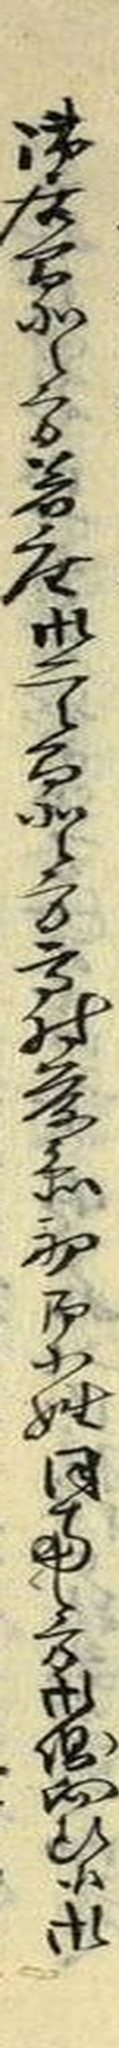御居間北之方着座御二之間北之方高村藤兵衛初御小姓同南之方御側向頭取御
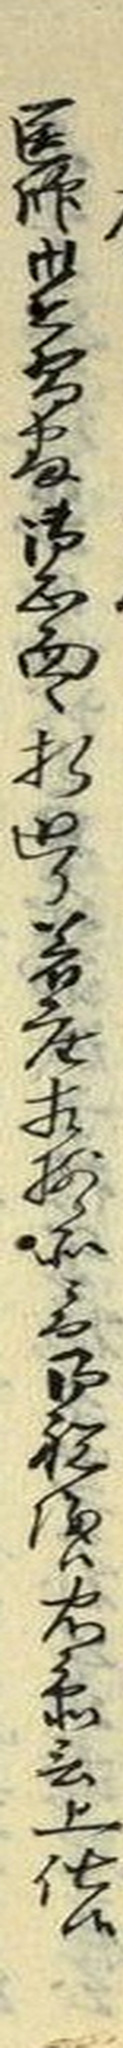医師御近習番御正面へ打廻り着座相揃候所ニ而御祝儀ハ忠兵衛言上仕候
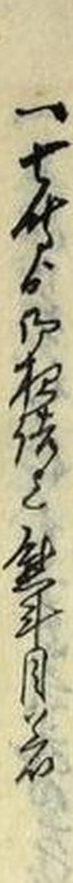一七時ゟ御夜詰迄熨斗目着
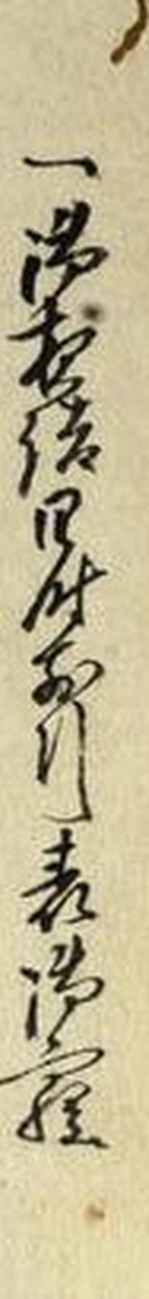一御夜詰四時前引表御寝
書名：少傅日録抄（斉善付側向頭取日記、在府）
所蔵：福井県文書館 Fukui Prefectural Archives
